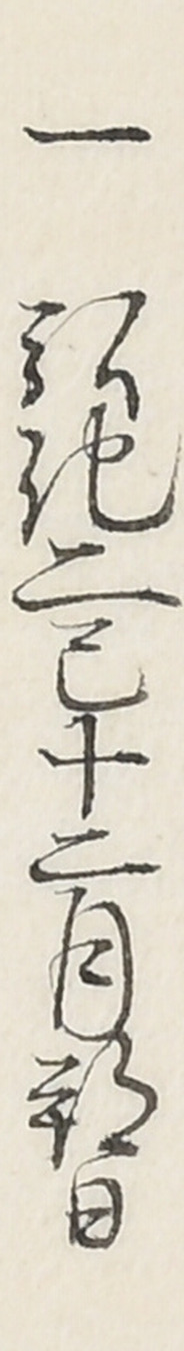一弘化二巳十二月朔日
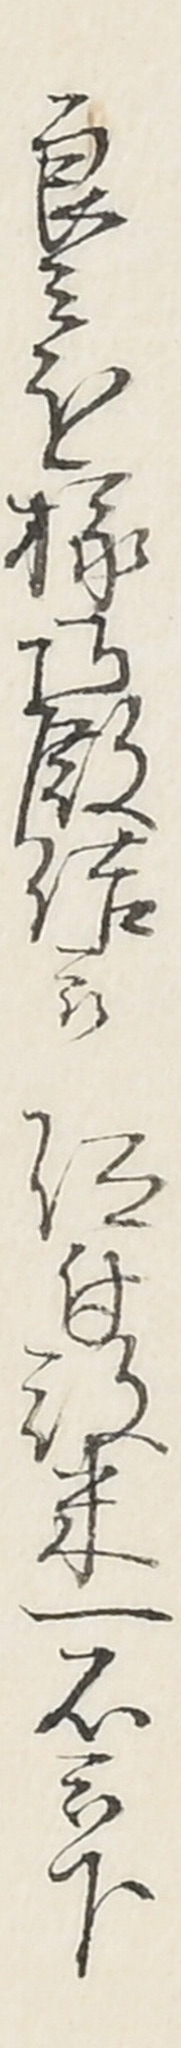良之進様御殿詰被仰付役米一石被下
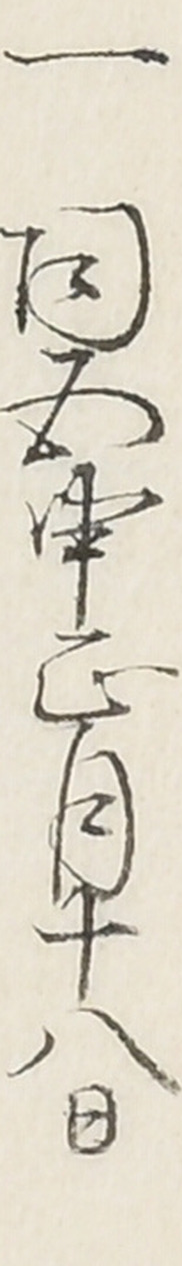一同五申正月十八日
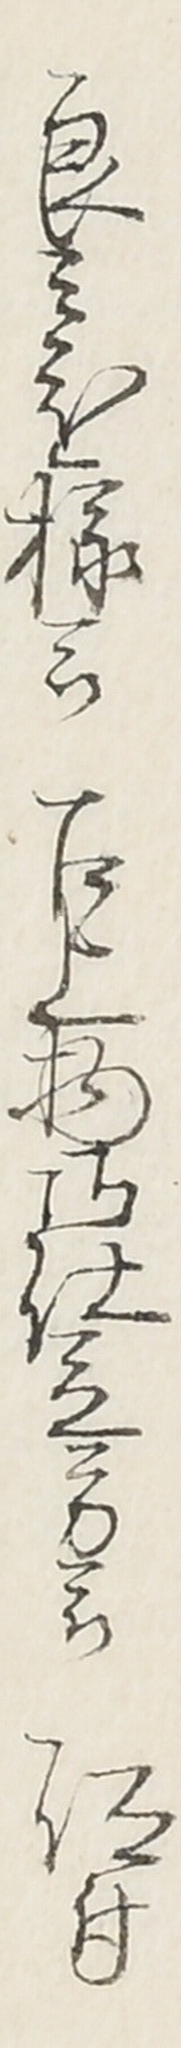良之進様被召上物御仕立方被仰付
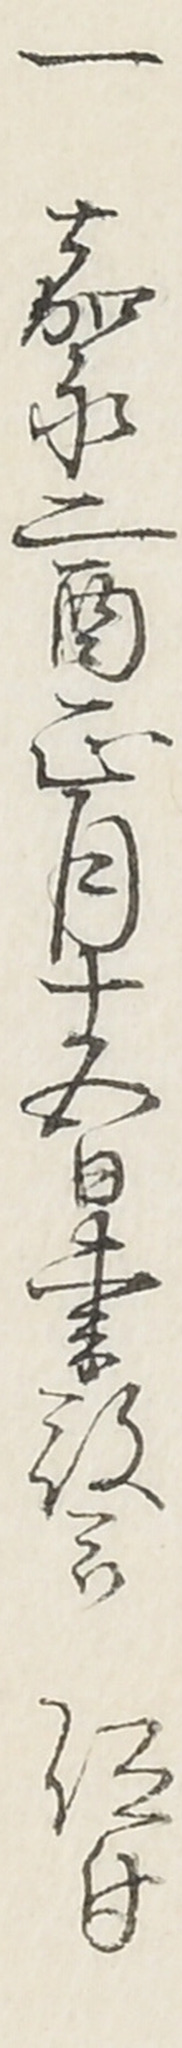一嘉永二酉正月十五日書役被仰付

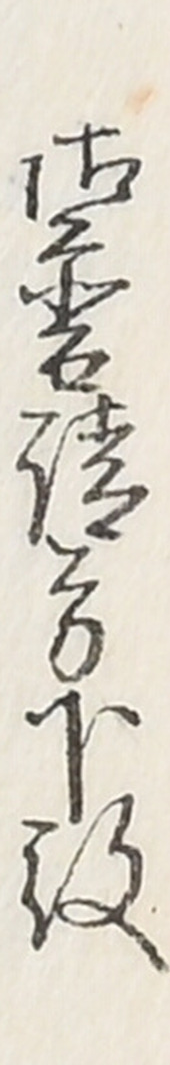御普請方下役
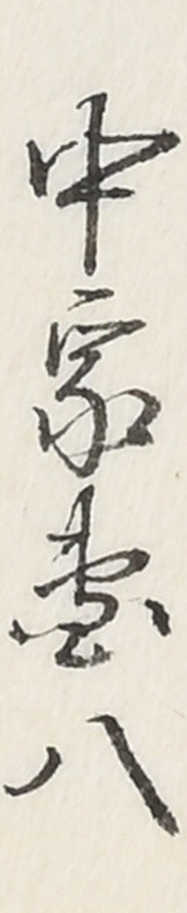中家団八
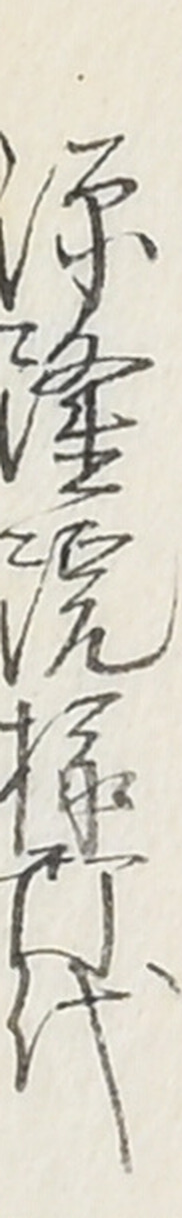源隆院様御代
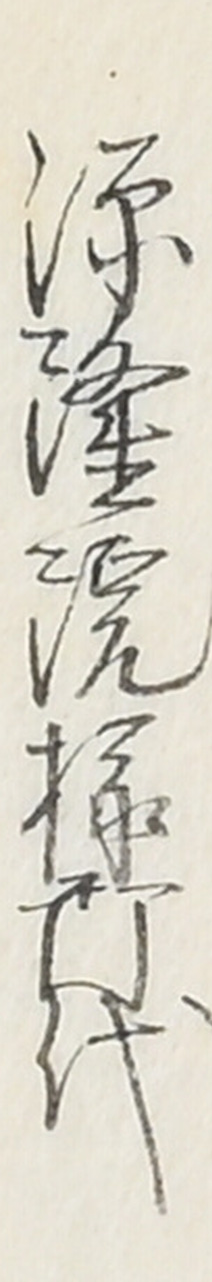源隆院様御代
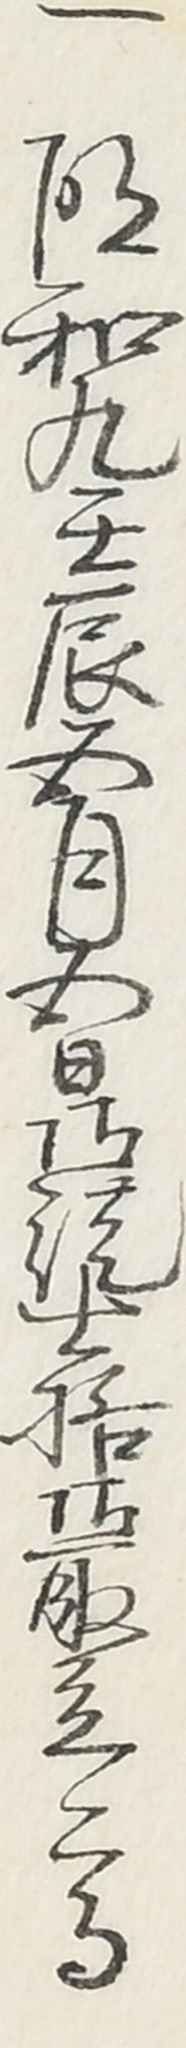一明和九壬辰五月五日御徒士格御取立高
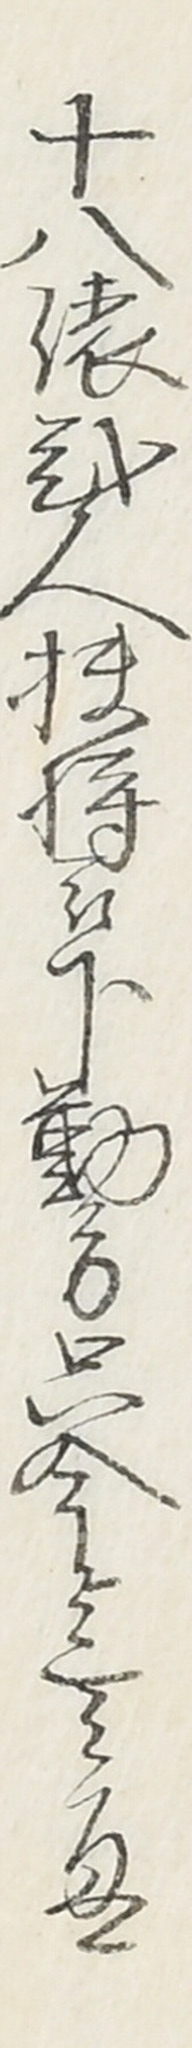十八俵弐人扶持被下勤方只今迄之通
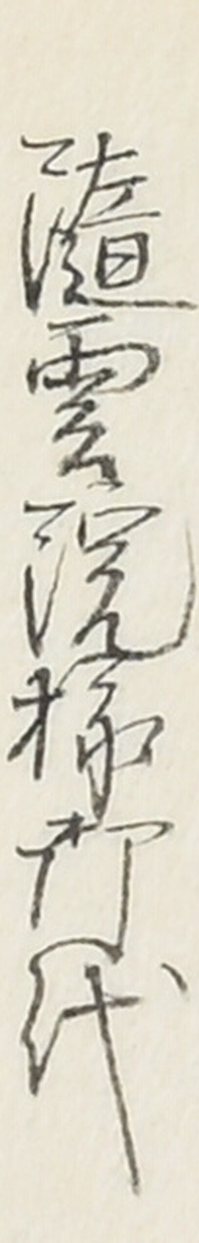随雲院様御代
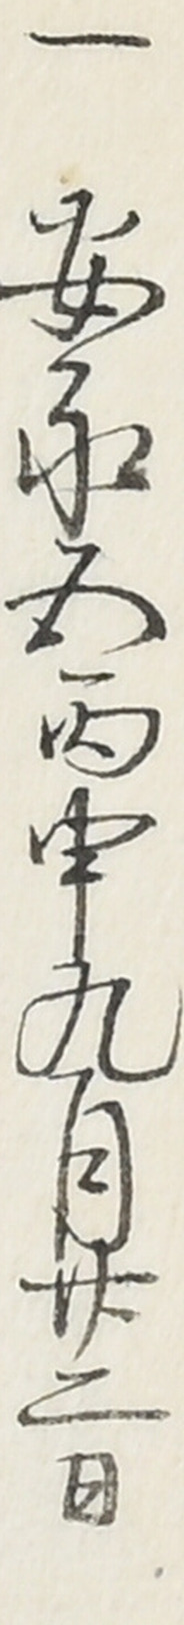一安永五丙申九月廿二日
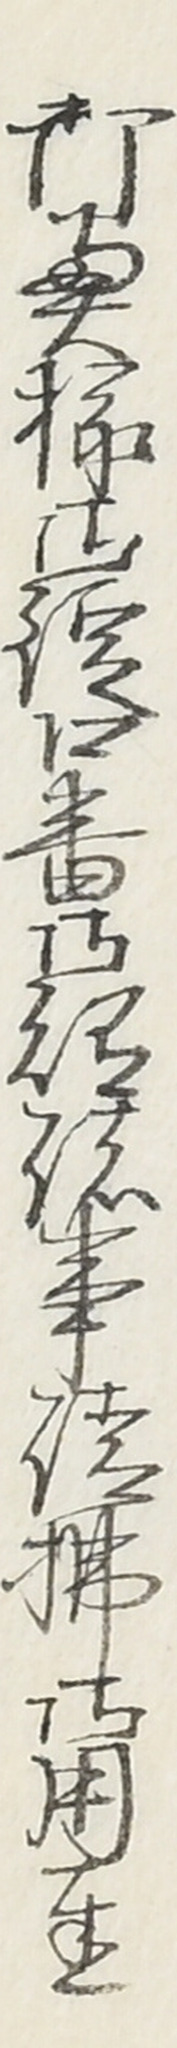御奥様御錠口番御賄諸事請払御用達
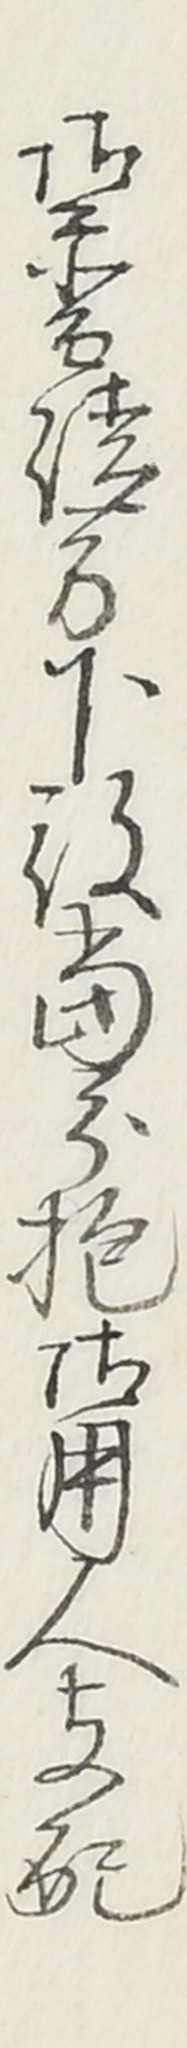御普請方下役当分抱御用人支配
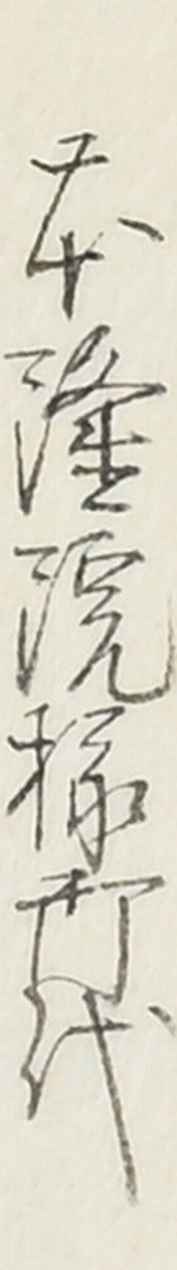本隆院様御代
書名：無足諸士勤仕録（四）
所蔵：伊那市立高遠町図書館・合同会社AMANE
